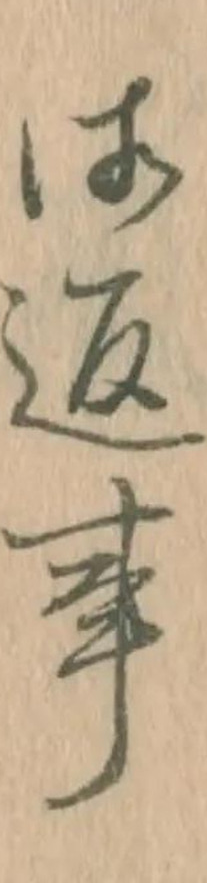御返事
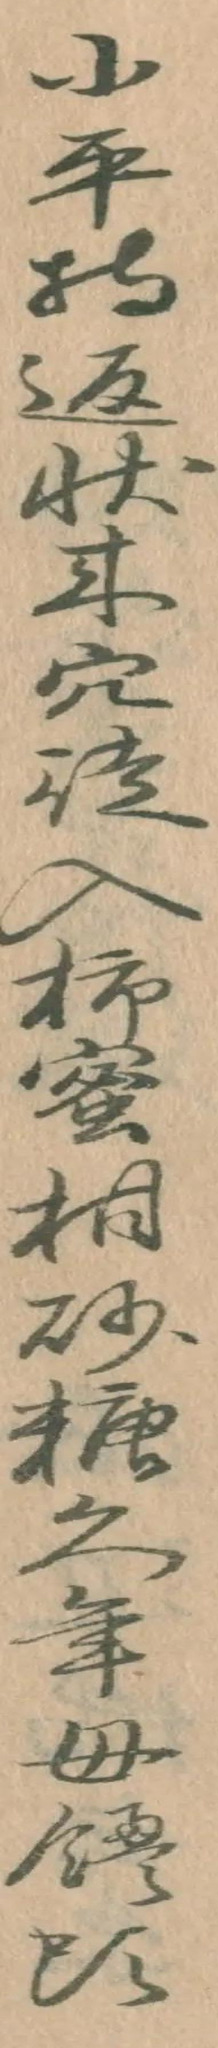小平持返状来穴徒入柿蜜柑砂糖久年母饅頭
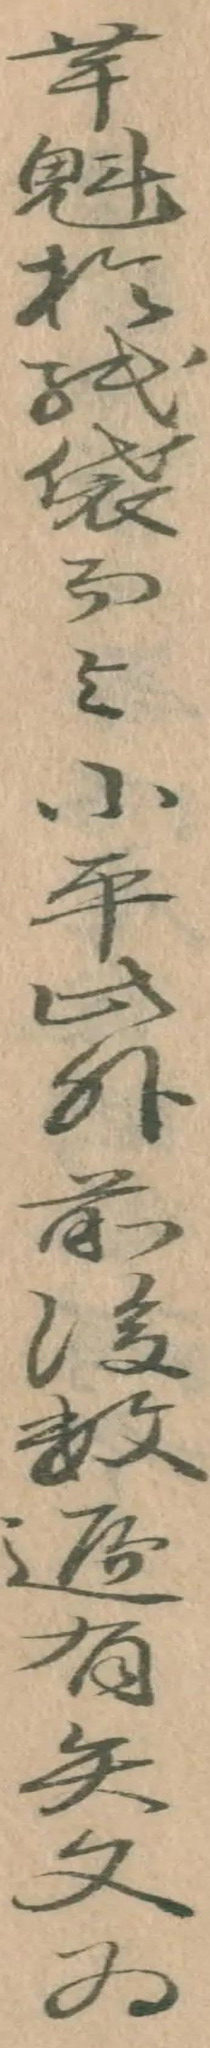芋魁於残袋而与小平此外前後数遍有矢文ゐ
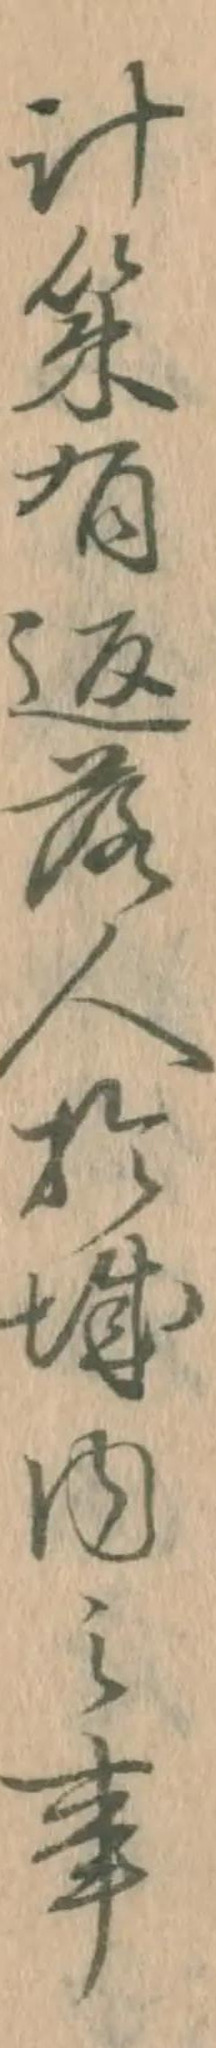計策有返落人於城内之事
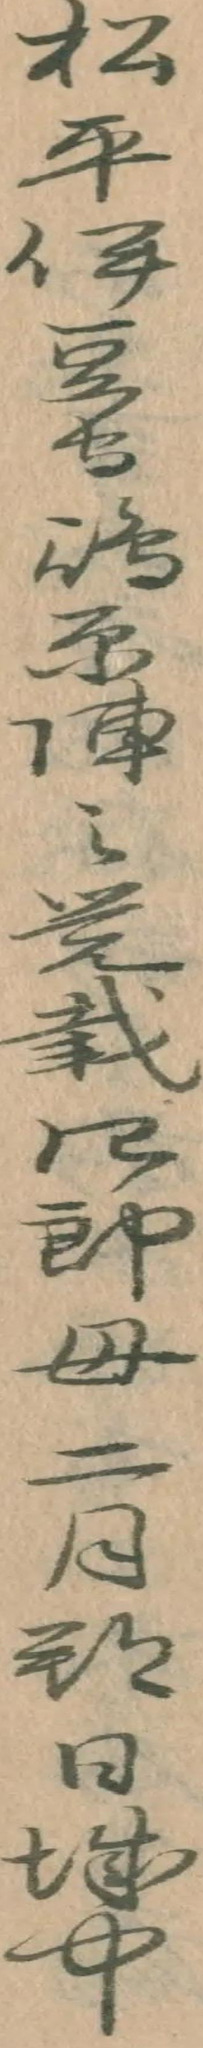松平伊豆守島原陣之覚載四郎母二月朔日城中
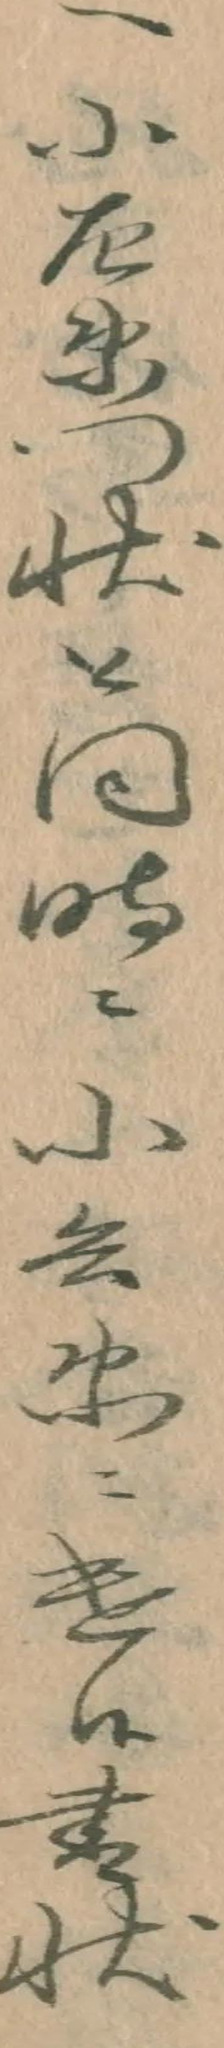へ小左衛門状と同時に小兵衛に遣候書状
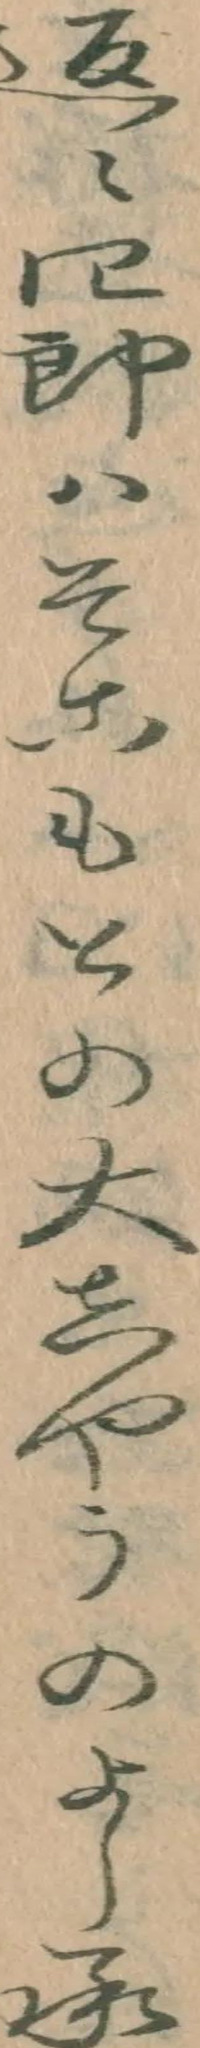返々四郎はそ古もとの大志やうのよし承
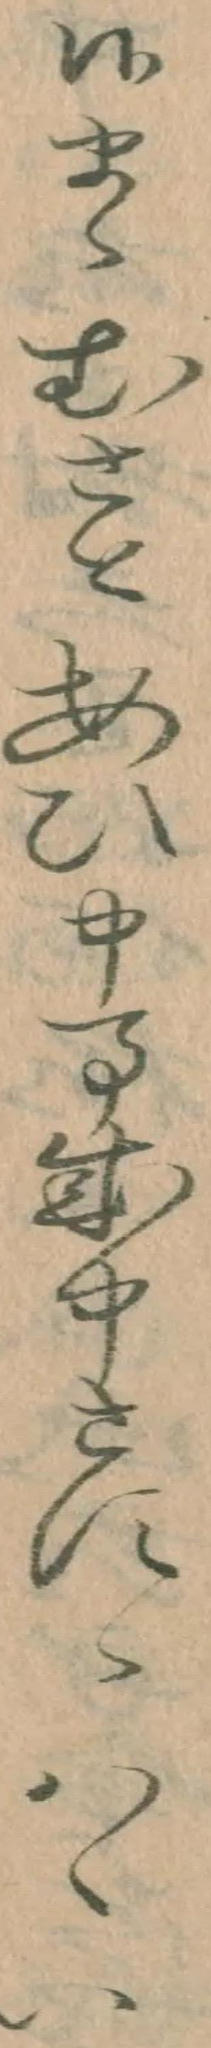候まゝむさとあひ申事成申さ須候はゝい
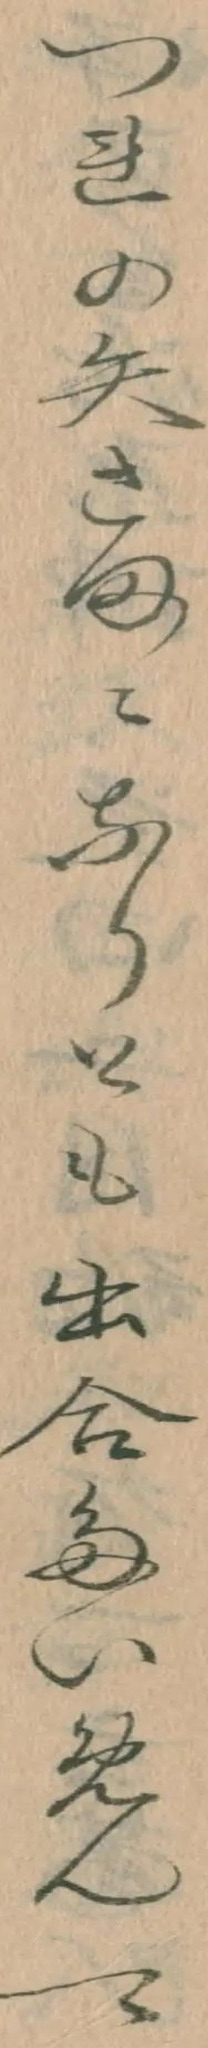つ連の矢さ満になりとも出合多い免ん可
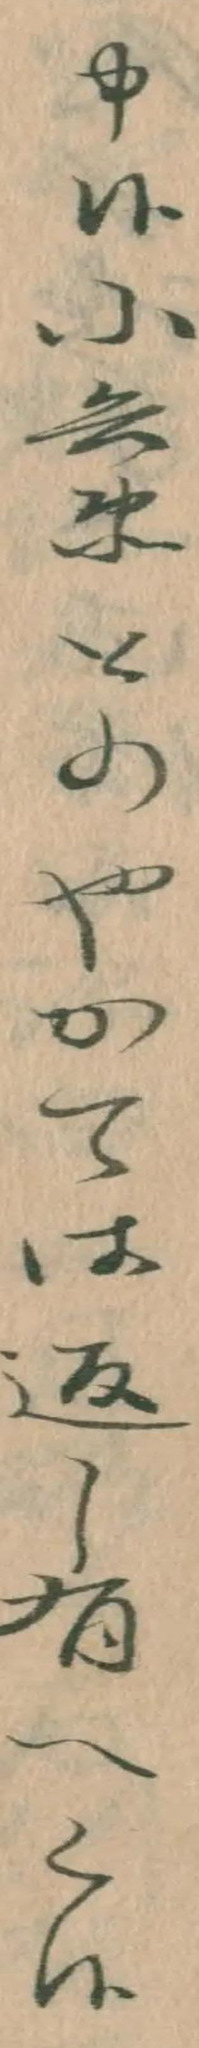申候小兵衛とのやかては返し有へく候
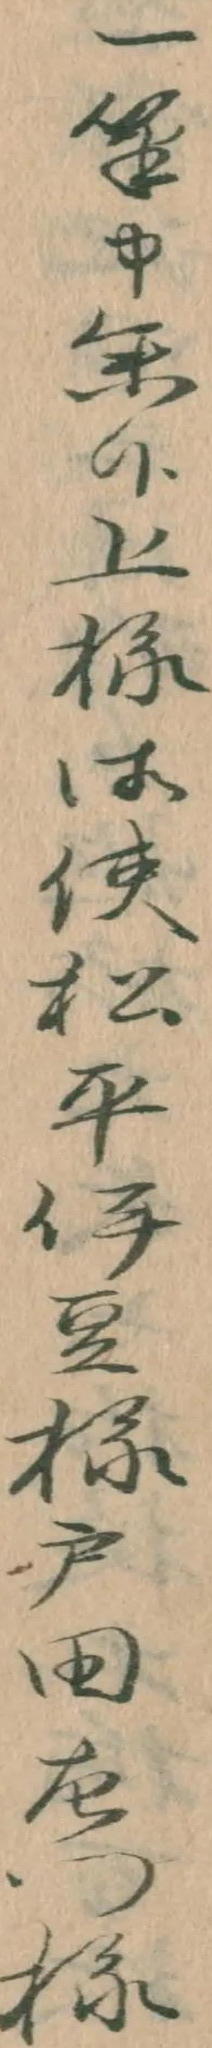一筆申参候上様御使松平伊豆様戸田左門様
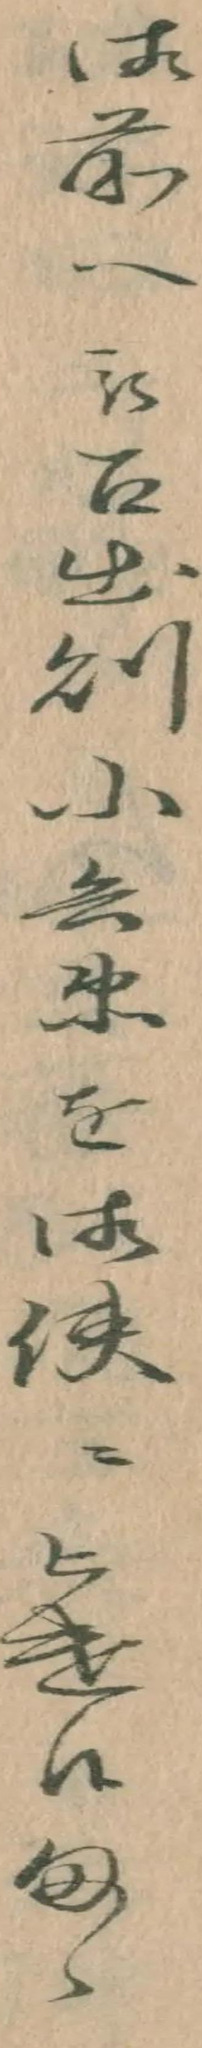御前へ被召出則小兵衛を御使に被遣候満々
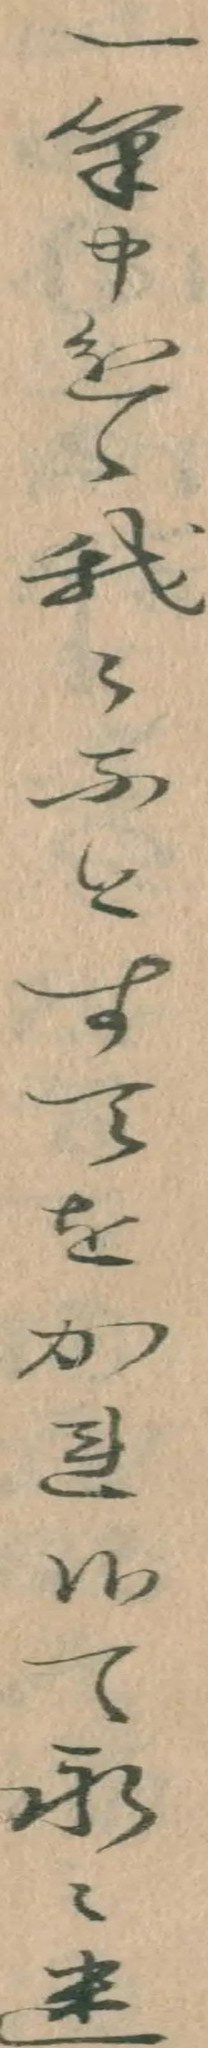一筆申進候我々なとすてをか連候て永々迷
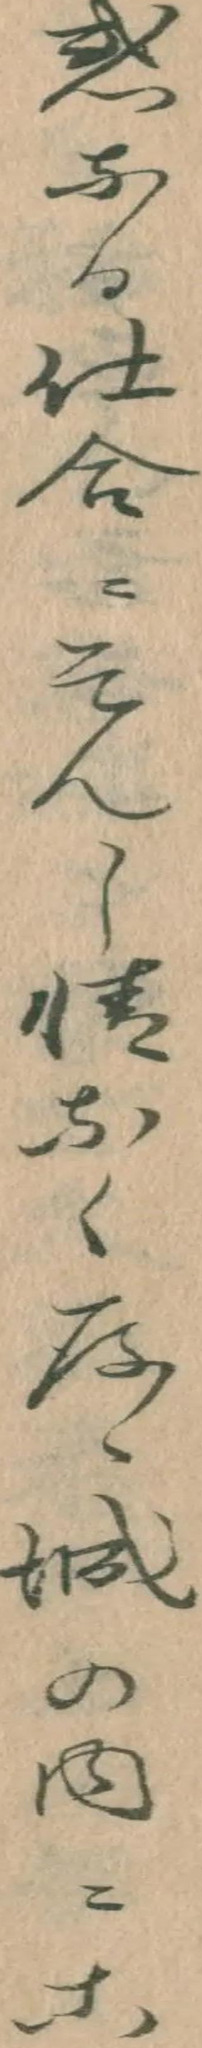惑なる仕合にそんし情なく存候城の内に古
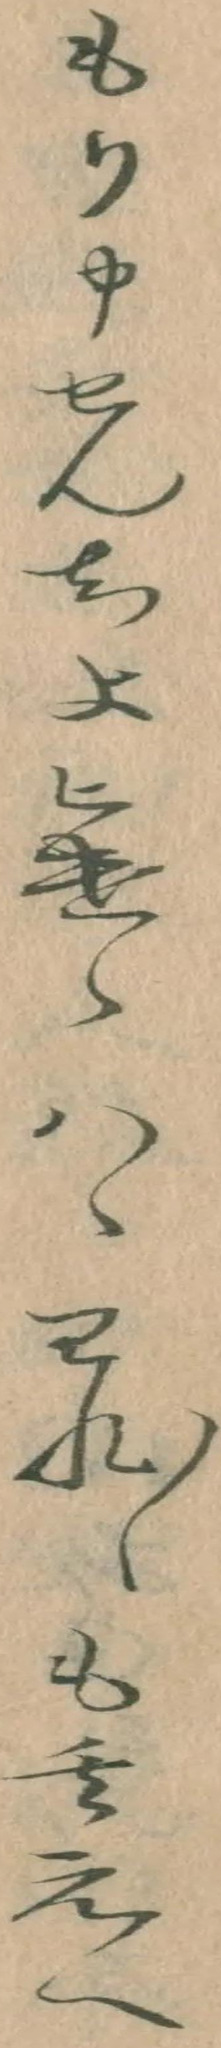もり申せんちよ被遣候はゝ己れ〱も其元へ
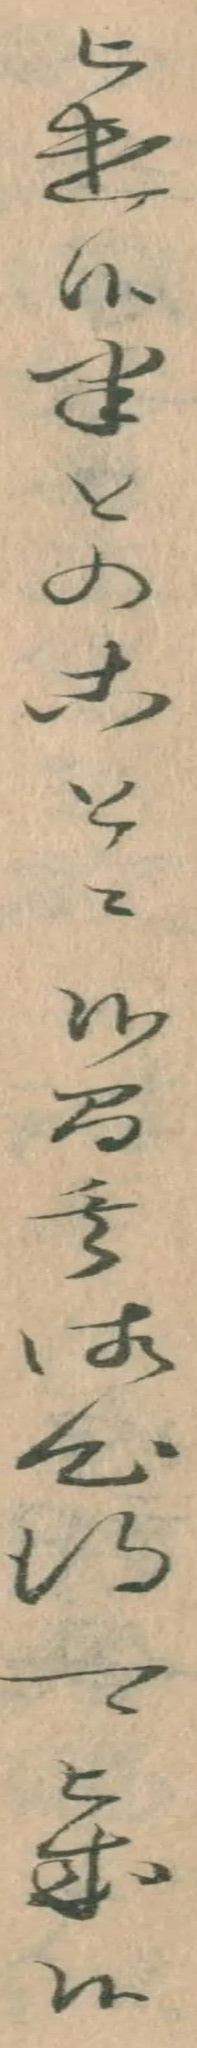被遣候半との古とに候間其御心得可被成候
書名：切支丹御退治記 49巻. [6]
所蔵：国立国会図書館 National Diet Library, JAPAN
